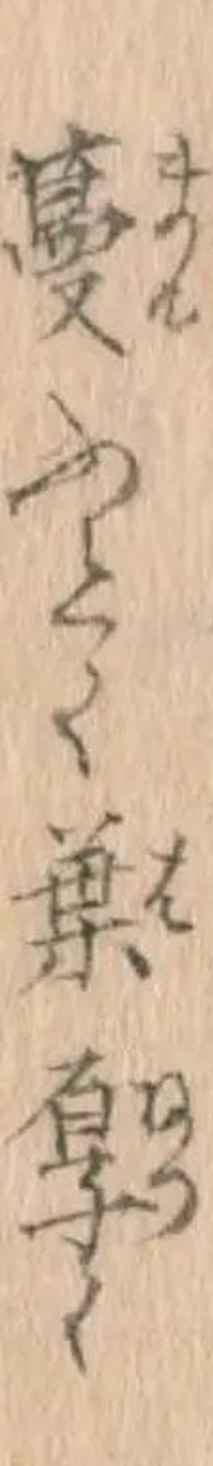蔓ふとく葉厚く
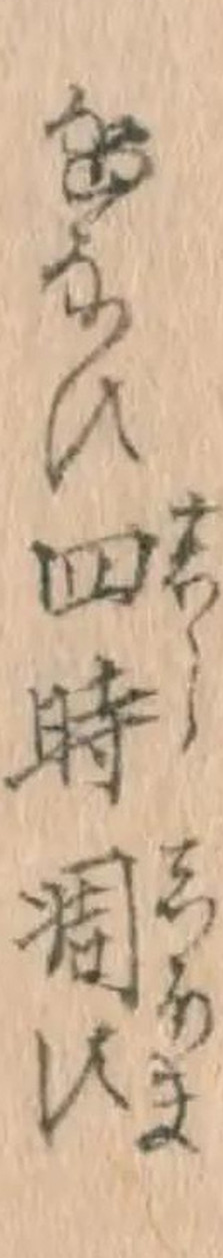をなす四時凋す
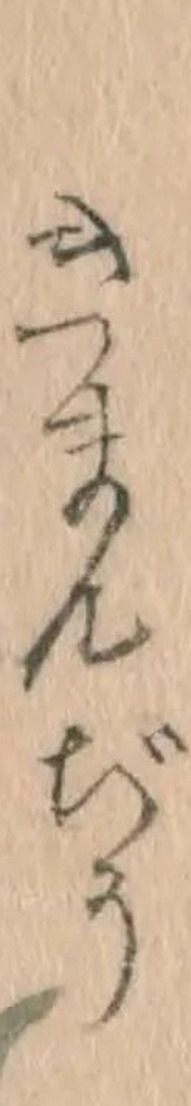きまんぢう
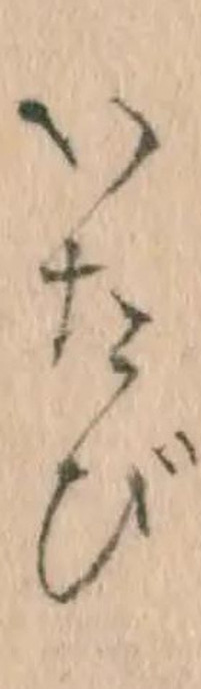いたび
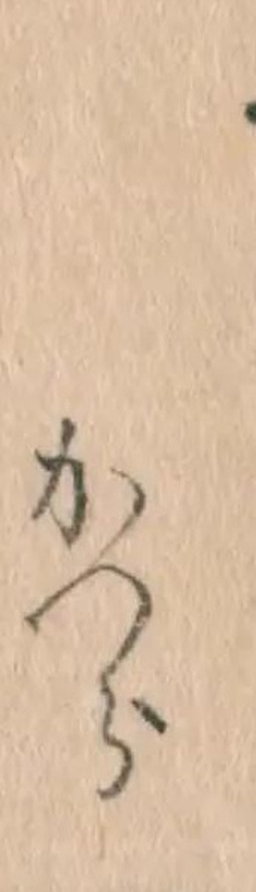かつら
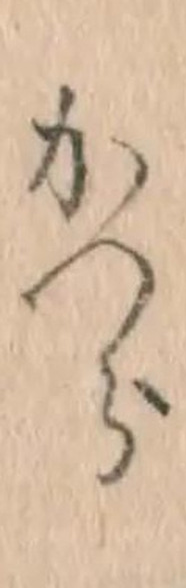かつら

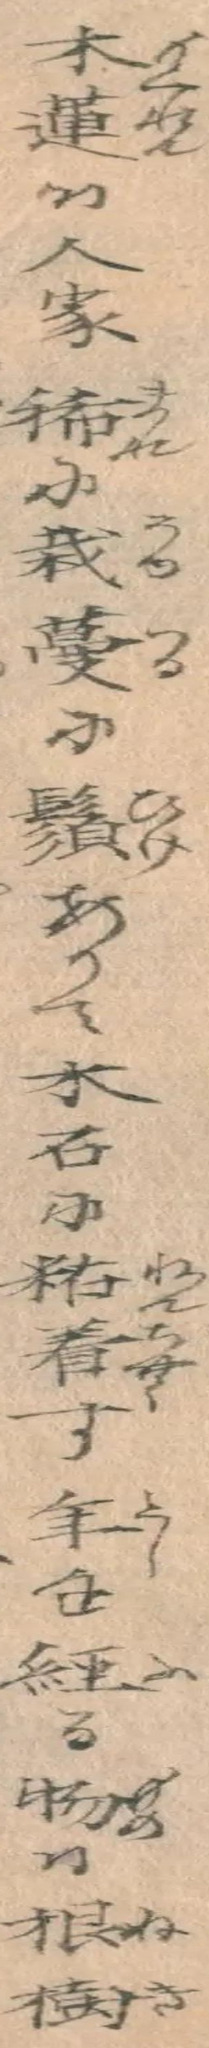木蓮は人家稀に栽蔓に鬚ありて木石に粘着す年を経る物は根樹
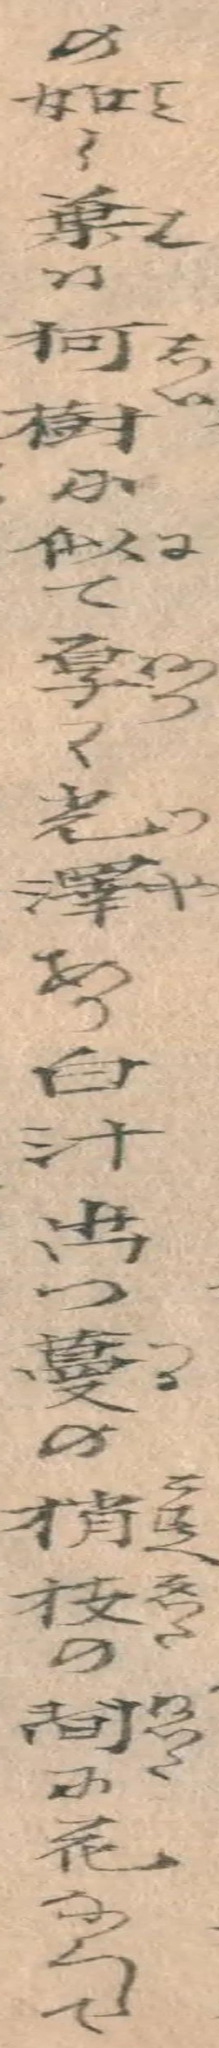の如し葉は柯樹に似て厚く光沢あり白汁出つ蔓の梢枝の間に花なくして
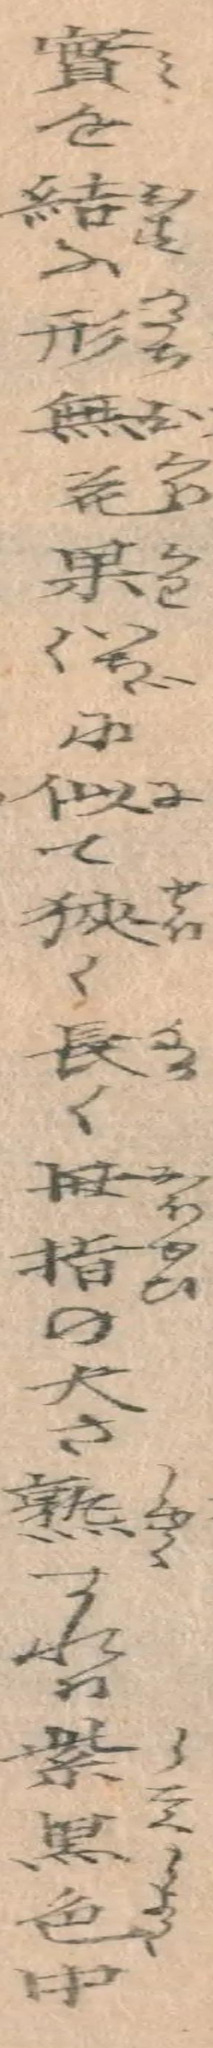実を結ふ形無花果いちゞくに似て狭く長く母指の大さ熟すれは紫黒色中
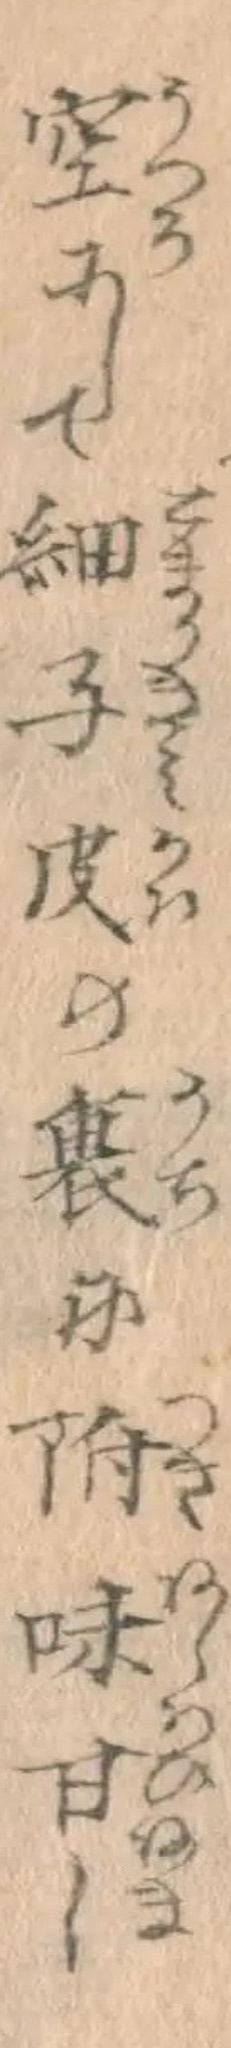空にして細子皮の裏に附味甘し
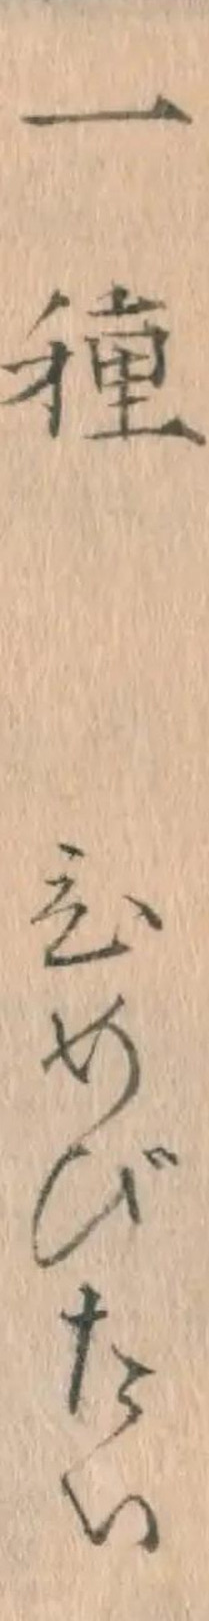一種ひめびたい
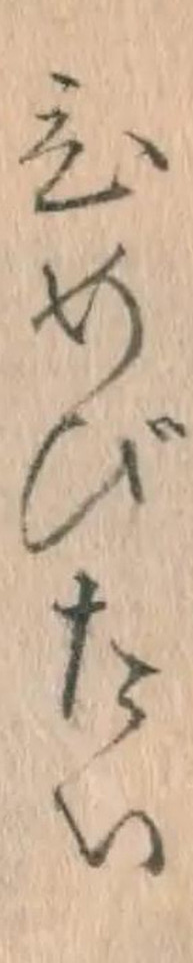ひめひたい
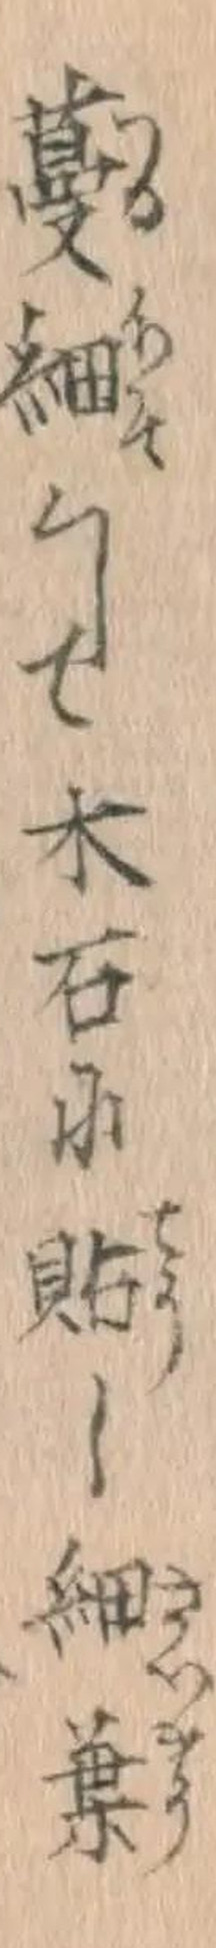蔓細くして木石に貼し細葉
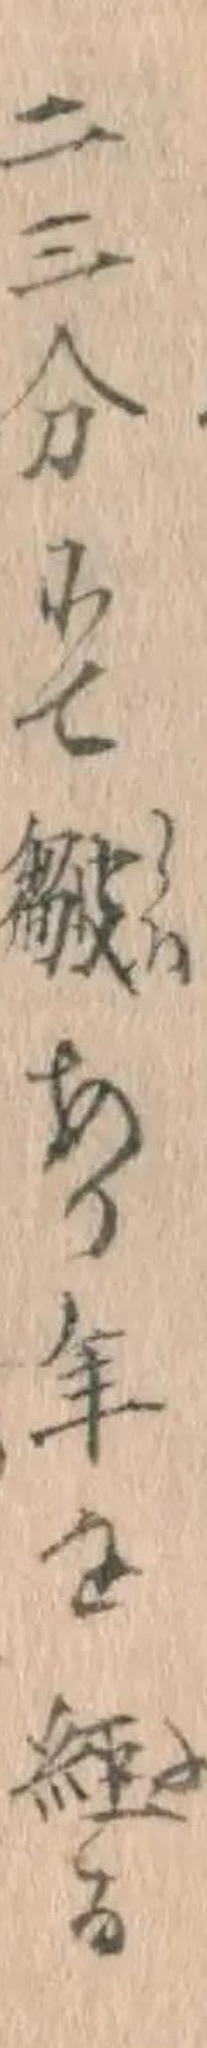二三分にて皺あり年を経る
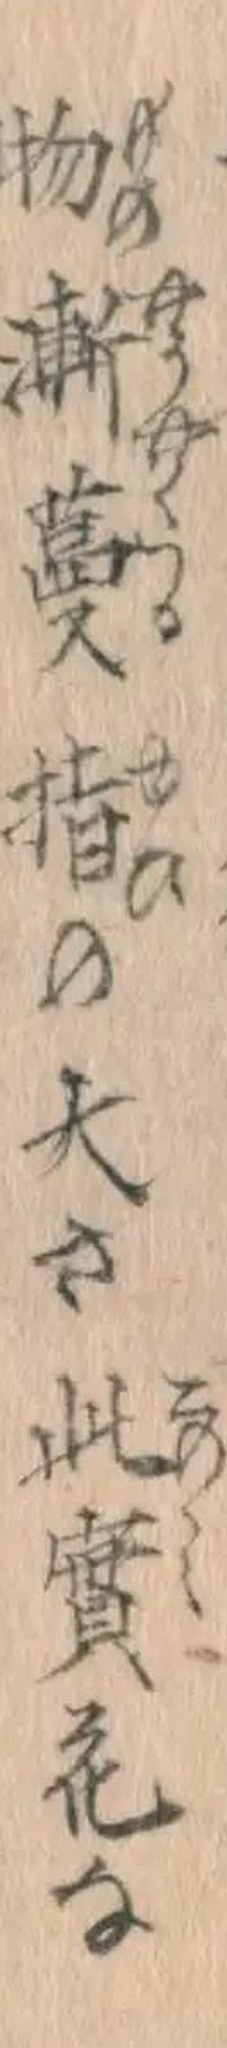物漸蔓指の大さ此実花な
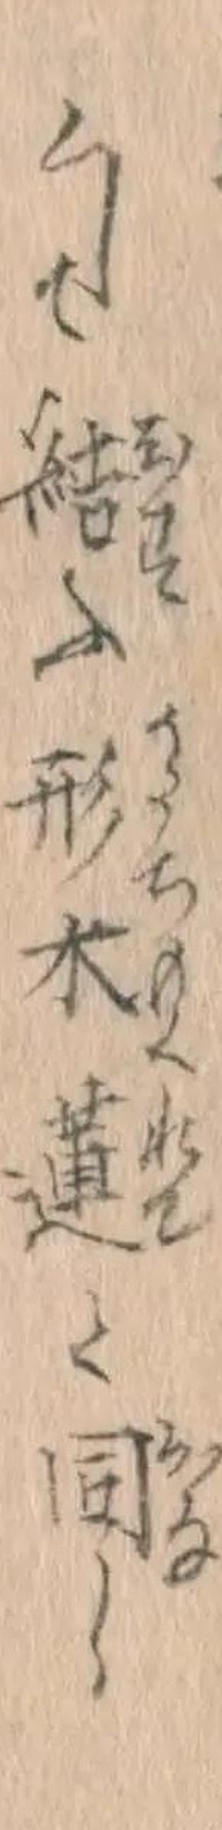くして結ふ形木蓮と同し
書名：本草図譜. 巻31-33
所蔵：国立国会図書館 National Diet Library, JAPAN
